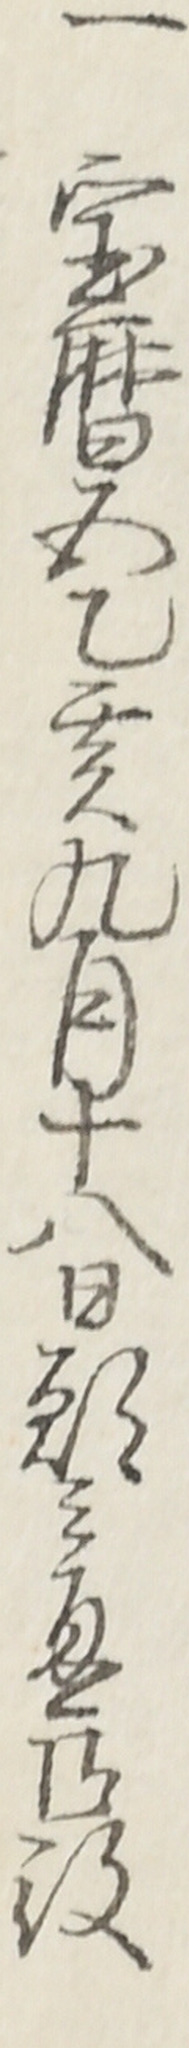一宝暦五乙亥九月十八日願之通御役
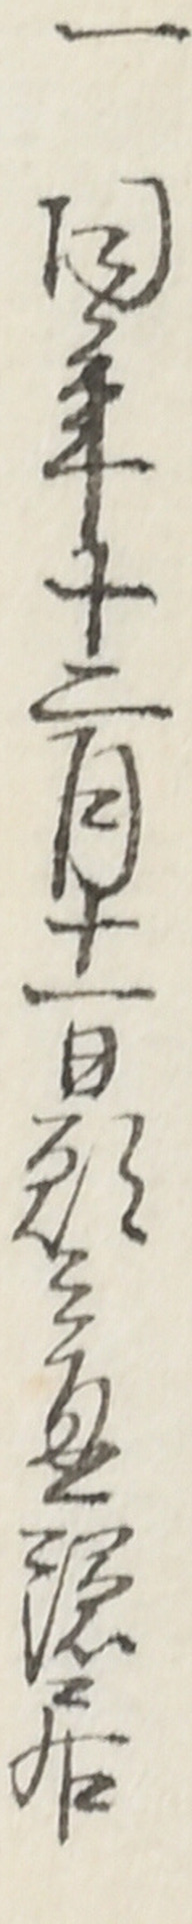一同年十二月十一日願之通隠居

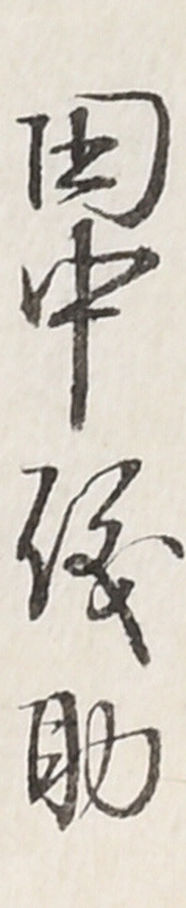田中儀助
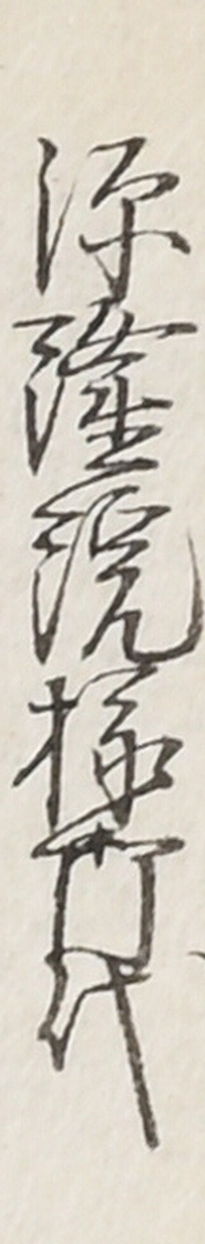源隆院様御代
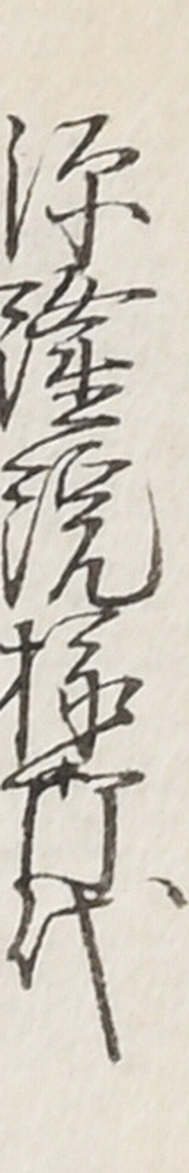源隆院様御代
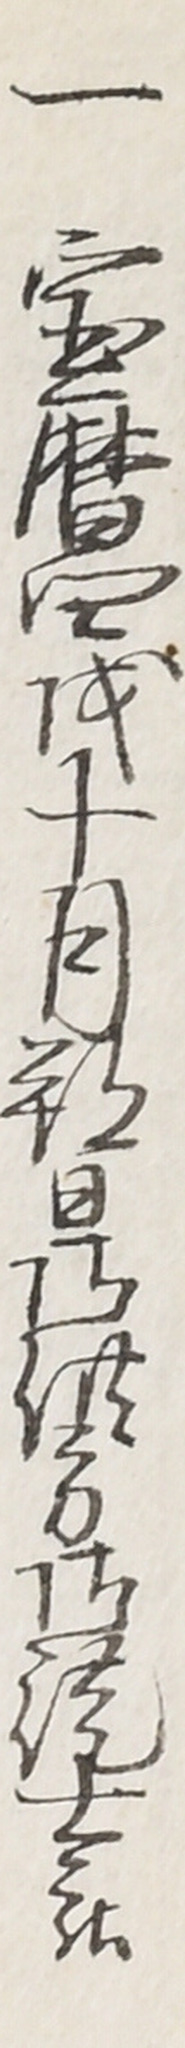一宝暦四戌十月朔日御供方御徒士被
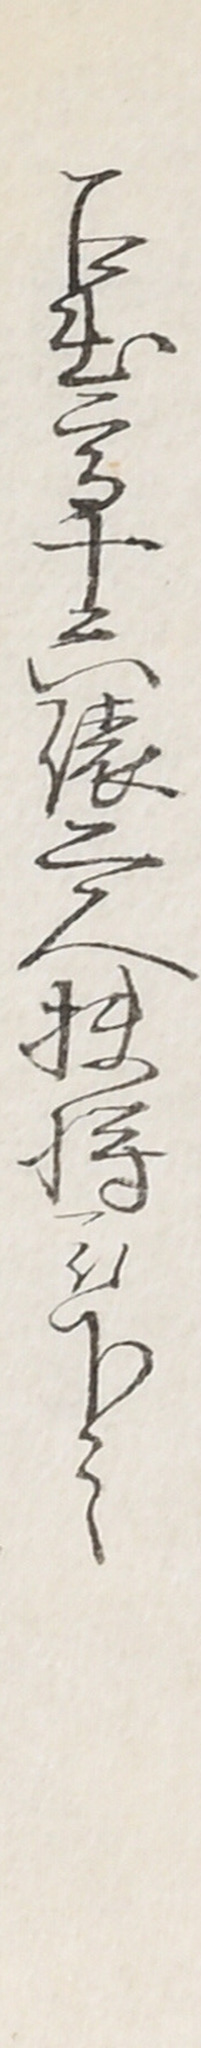召出高十六俵二人扶持被下之
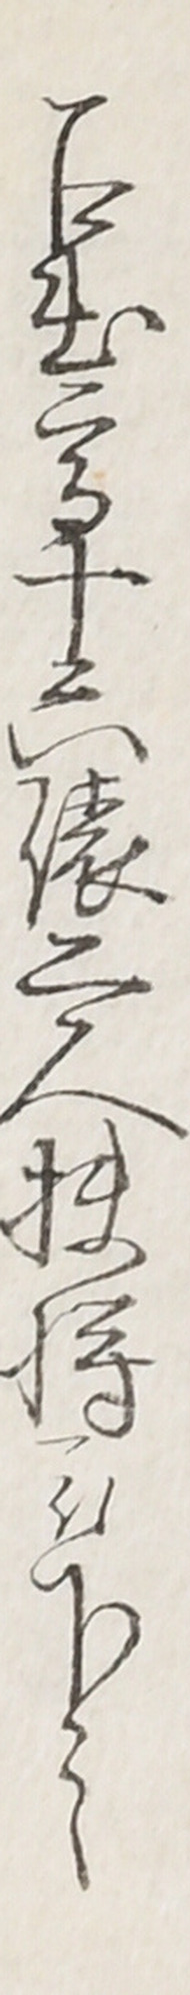召出高十六俵二人扶持被下之
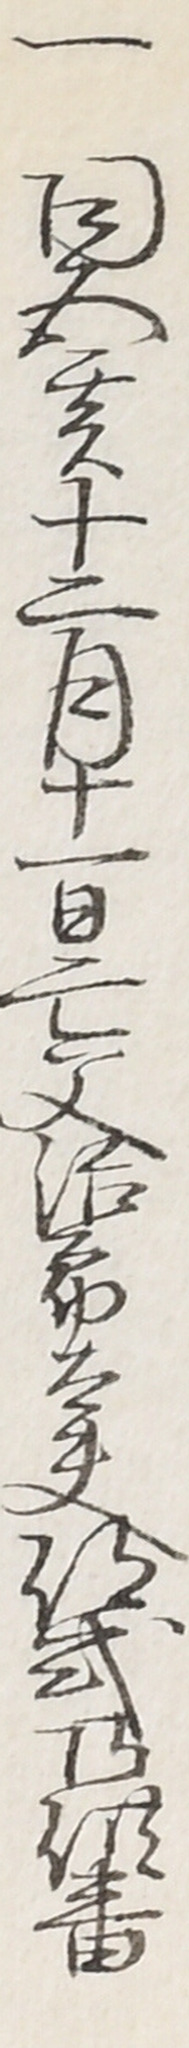一同五亥十二月十一日亡父治郎太夫跡式御供番
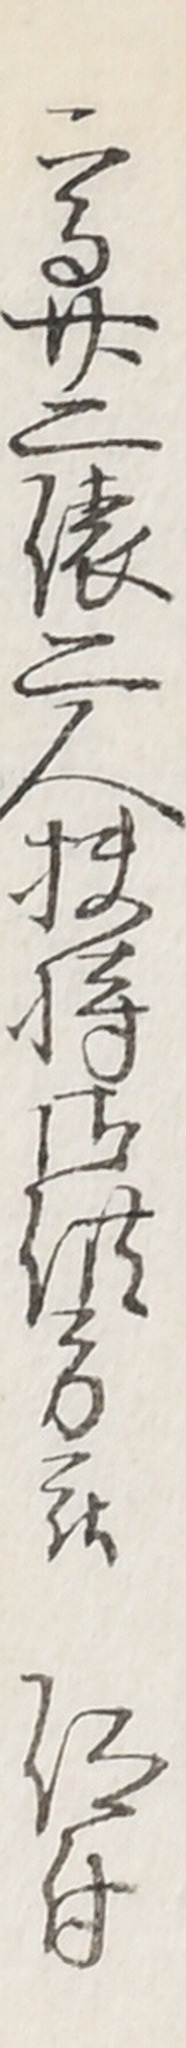高廿二俵二人扶持御供方被仰付
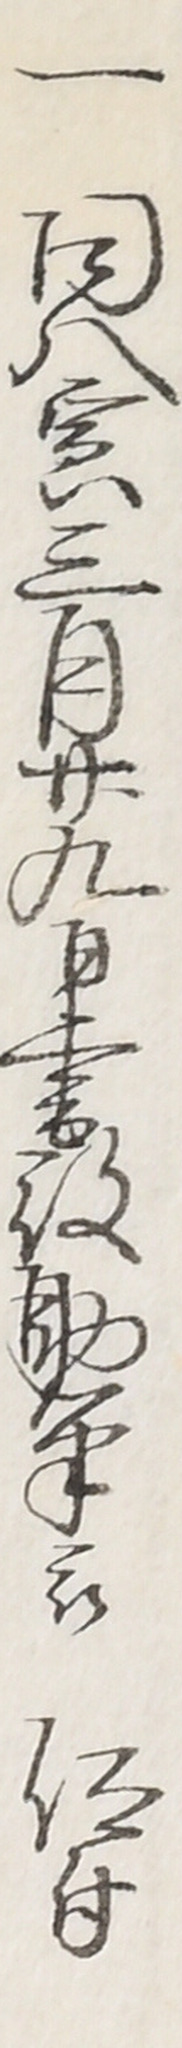一同八寅三月廿九日書役助筆被仰付
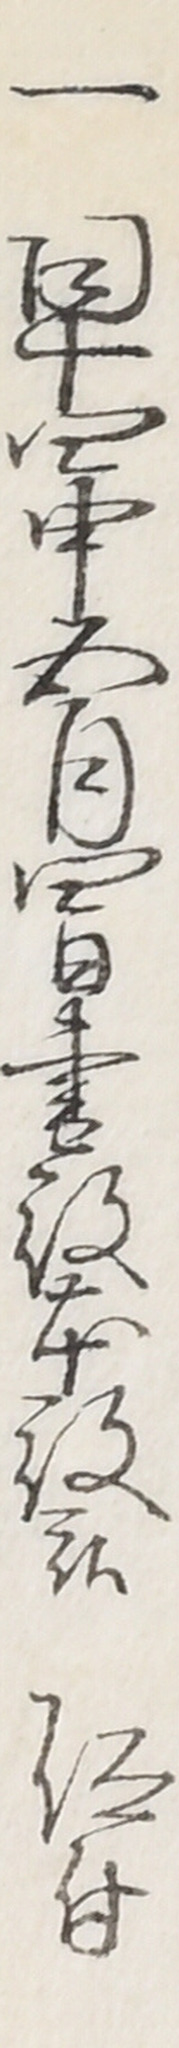一同十四申五月四日書役本役被仰付
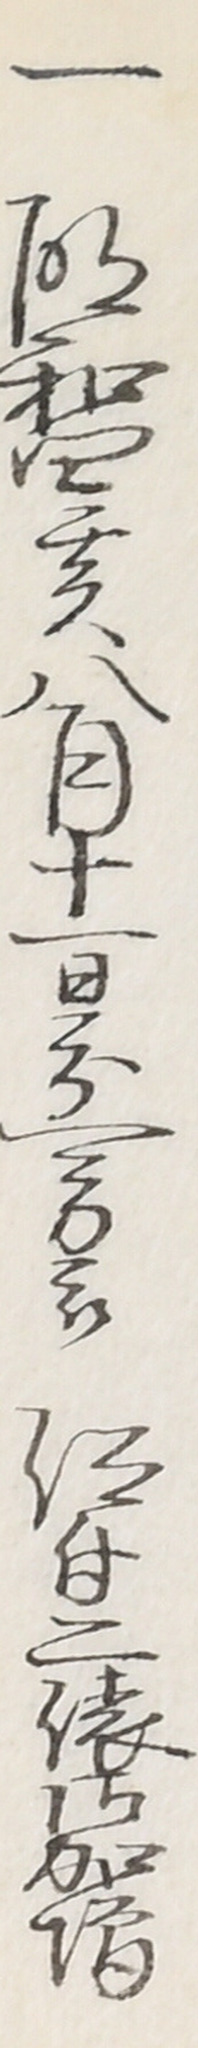一明和四亥八月十一日分一方被仰付二俵御加増
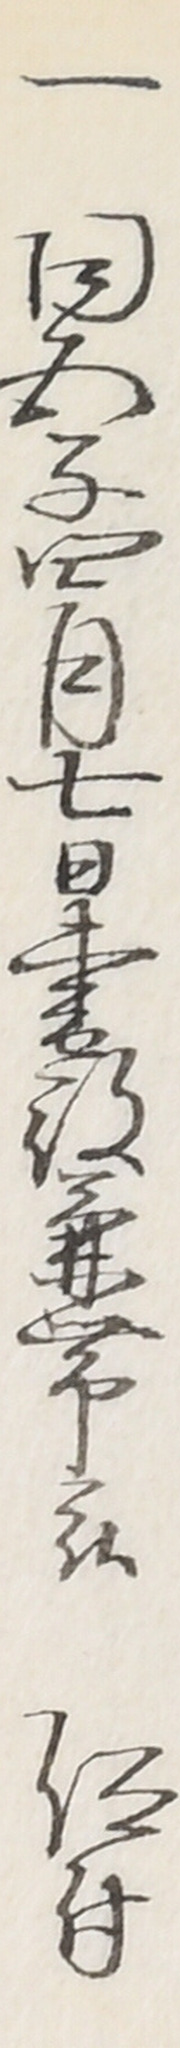一同五子四月七日書役兼帯被仰付
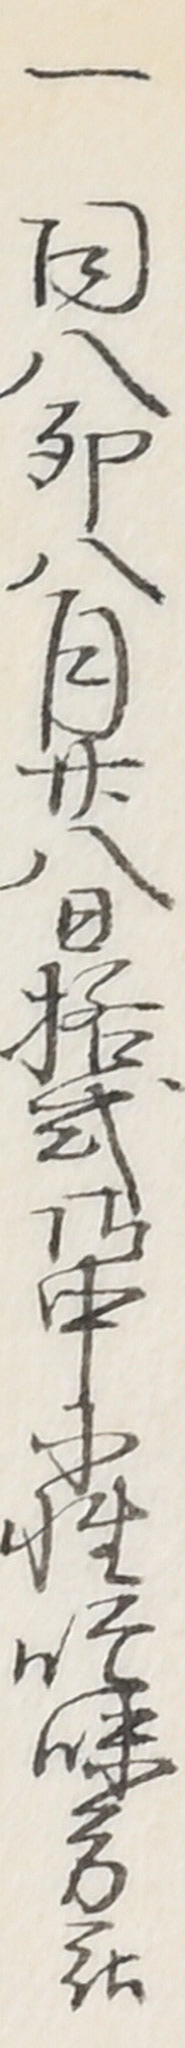一同八卯八月廿八日格式御中小性吟味方被
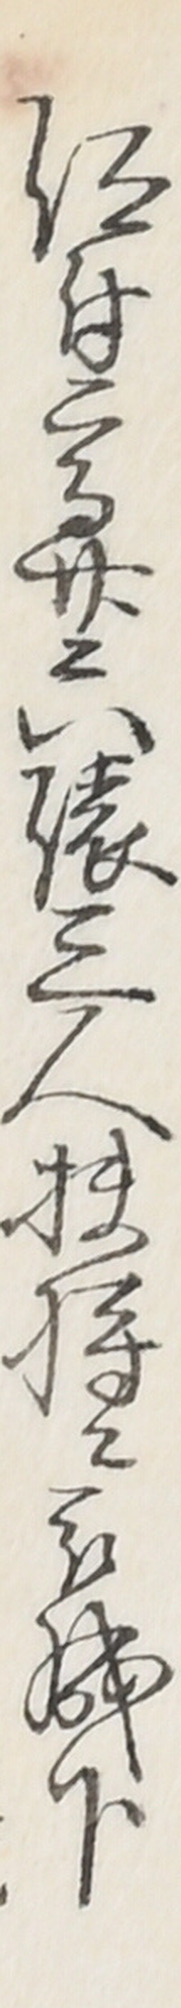仰付高廿六俵三人扶持ニ被成下
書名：給人諸士勤仕録（七）
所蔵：伊那市立高遠町図書館・合同会社AMANE
